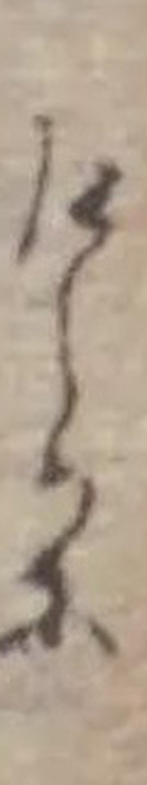たしかに
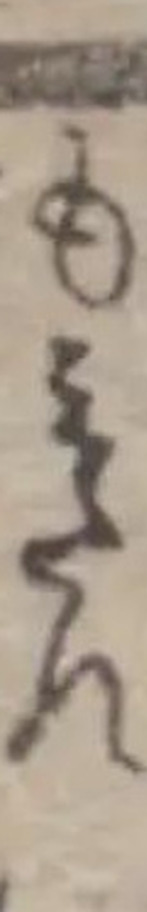もみたれ
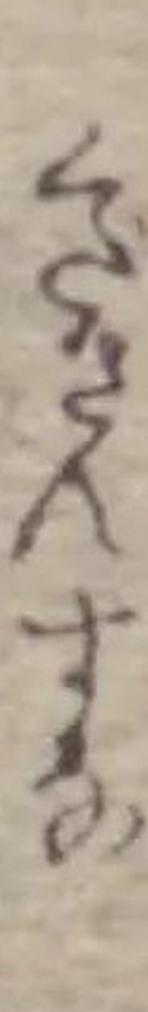くださんすな
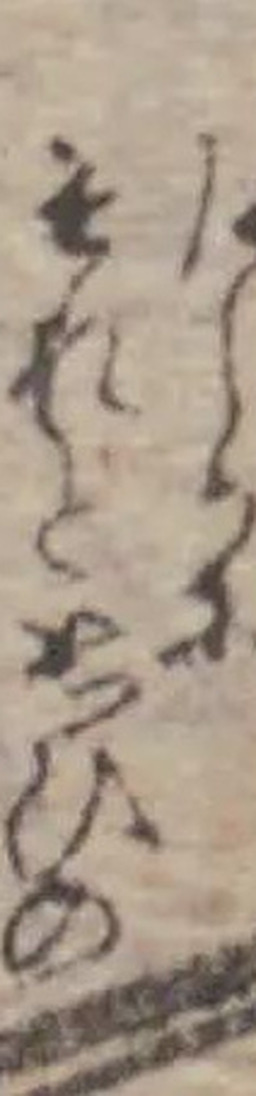それと思ひの
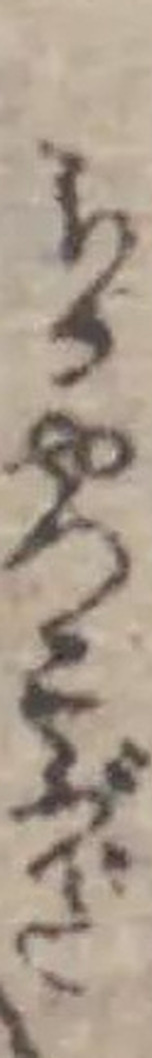ほかやつこぶざ
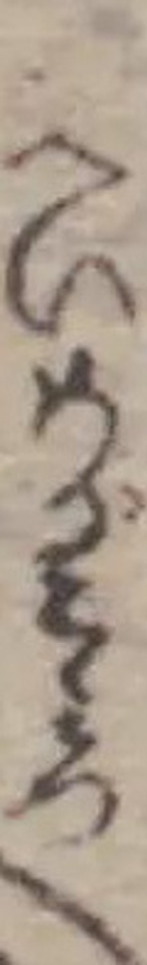へいめがこゝろ
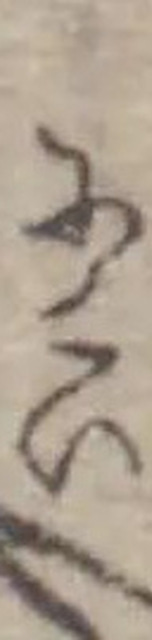にくい
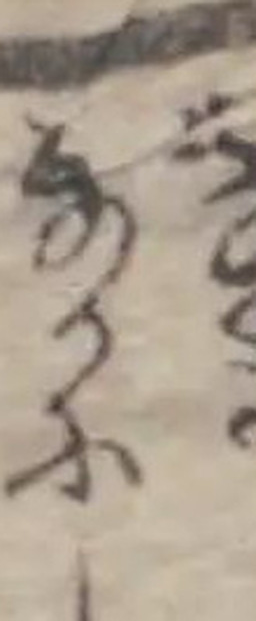なかに
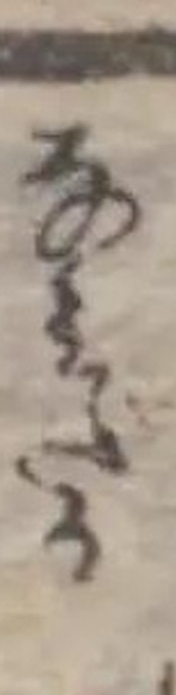なみだか
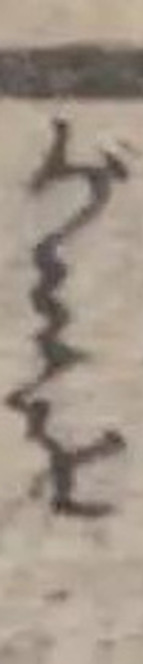がみを
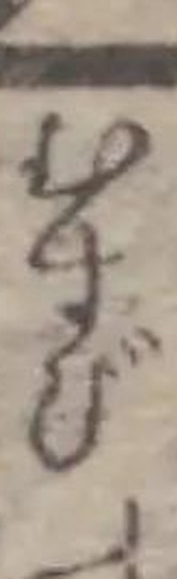むすび
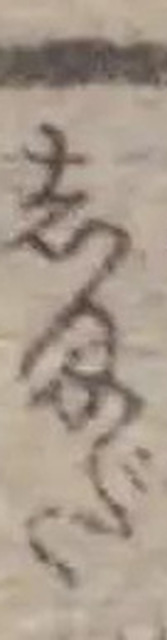しまだ
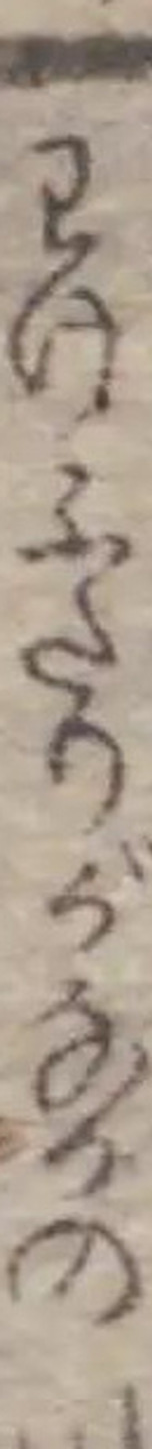わけふたりがなかの
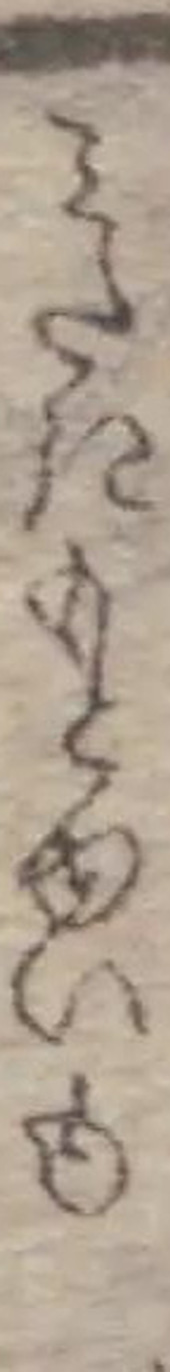みたきもとゆいも
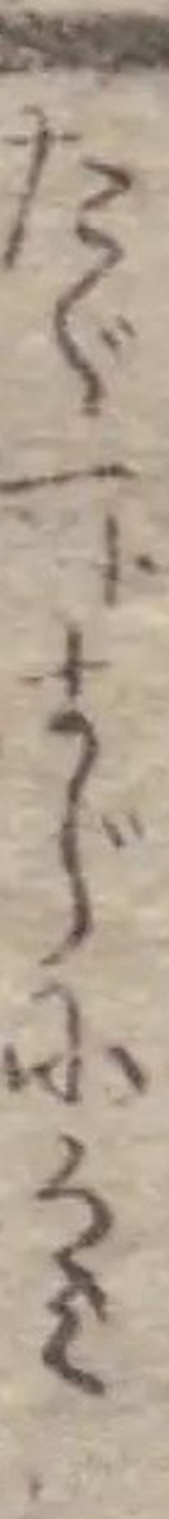たゞ一トすじにかみ
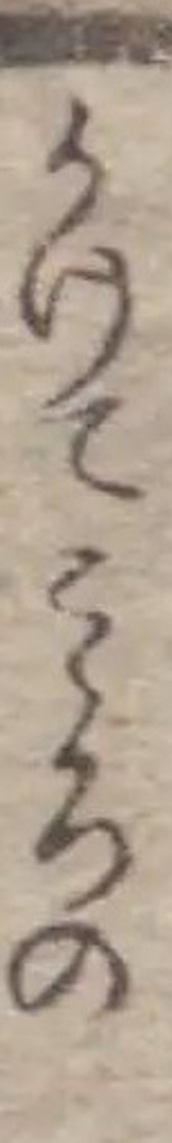かけてこゝろの
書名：富多高慢噺 3巻
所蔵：国立国会図書館 National Diet Library, JAPAN
